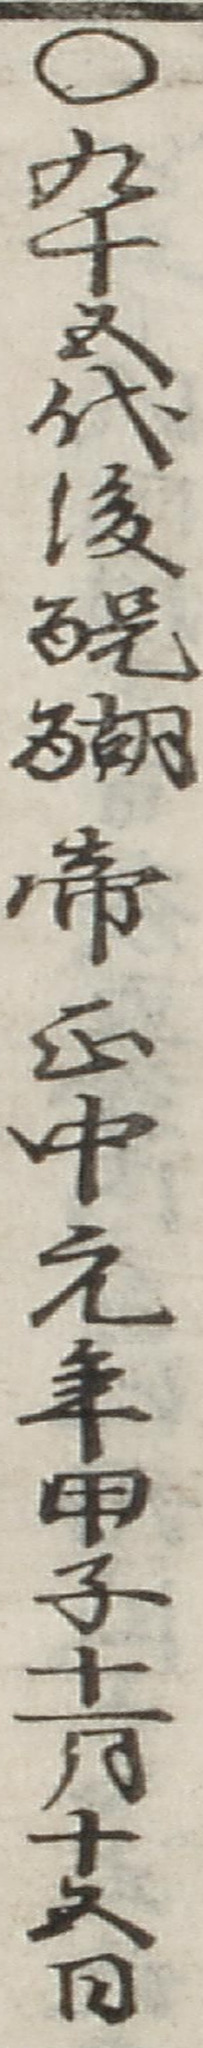○九十五代後醍醐帝正中元年甲子十一月十五日
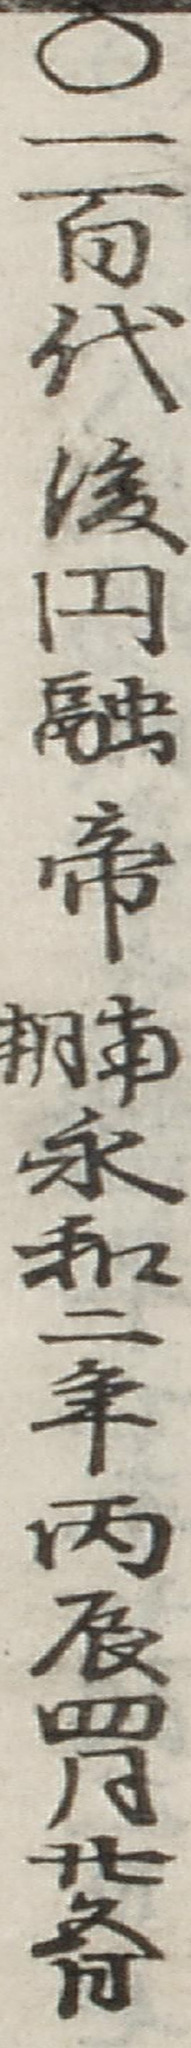○一百代後円融帝南朝永和二年丙辰四月廿五日
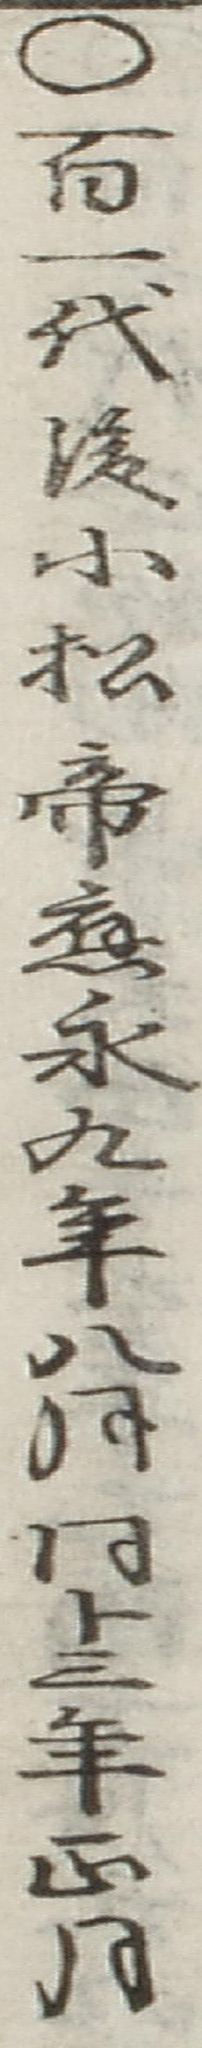○百一代後小松帝応永九年八月同十三年正月
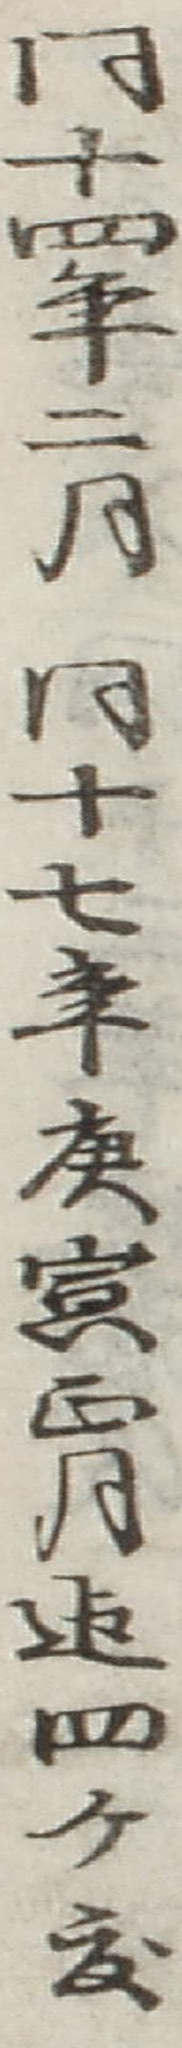同十四年二月同十七年庚寅正月迄四ヶ度
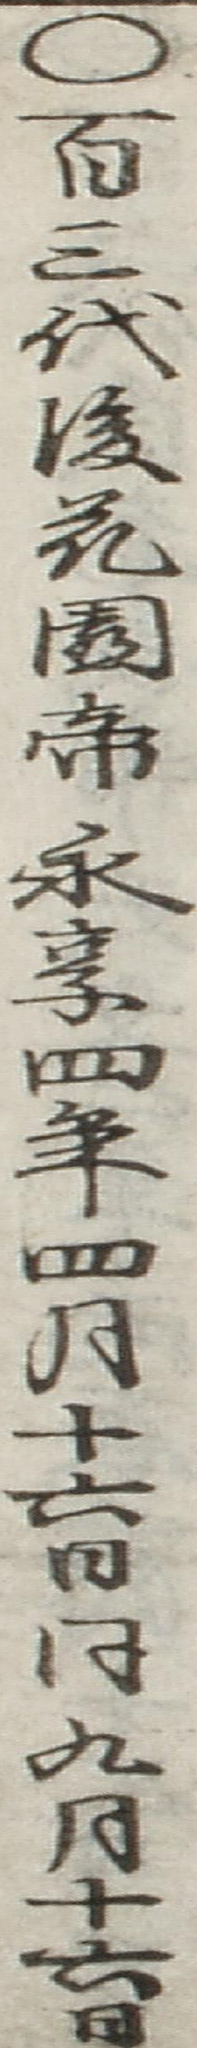○百三代後花園帝永享四年四月十六日同九月十六日
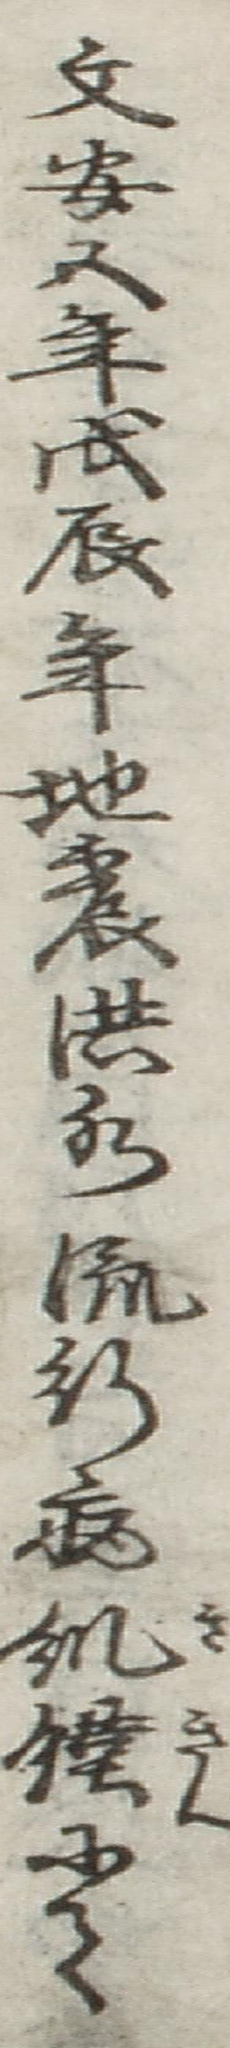文安五年戌辰年地震洪水流行病飢饉にて
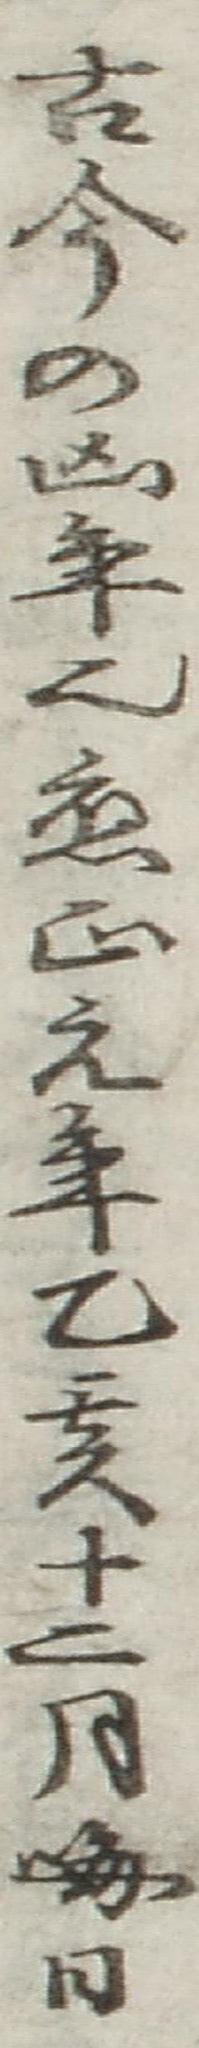古今の凶年也応正元年乙亥十二月晦日
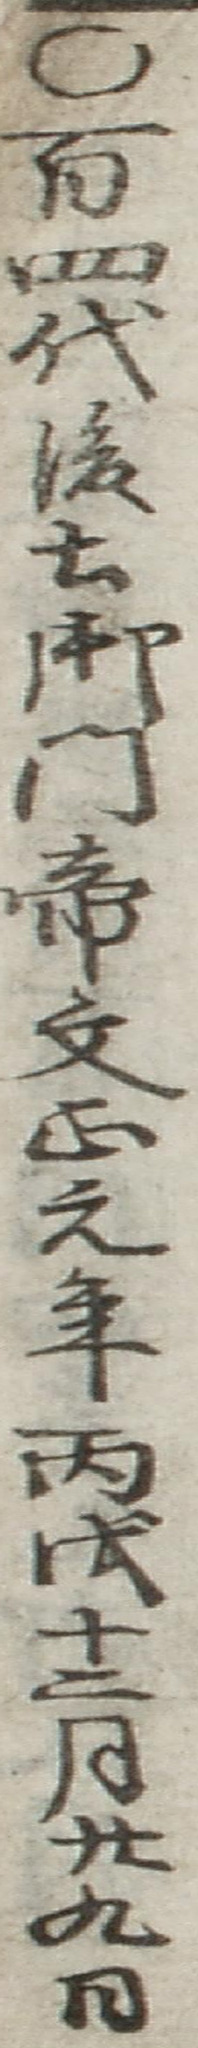○百四代後土御門帝文正元年丙戌十二月廿九日

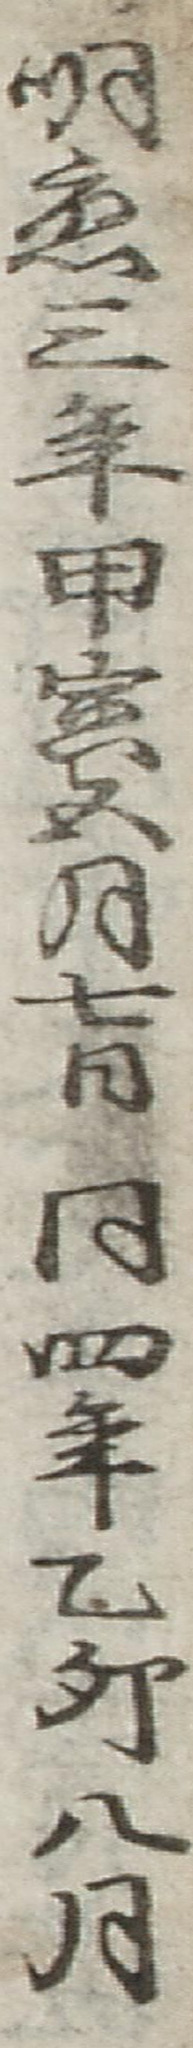明応三年甲寅五月七日同四年乙卯八月
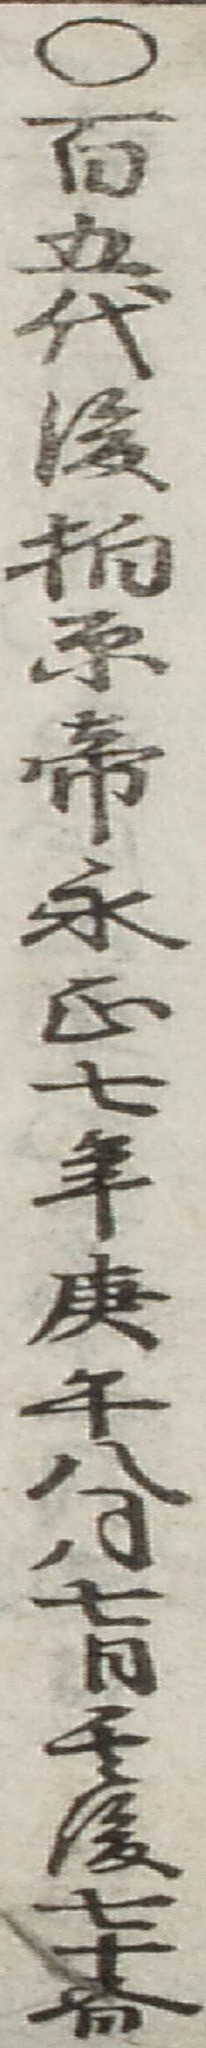○百五代後柏原帝永正七年庚午八月七日其後七十五日
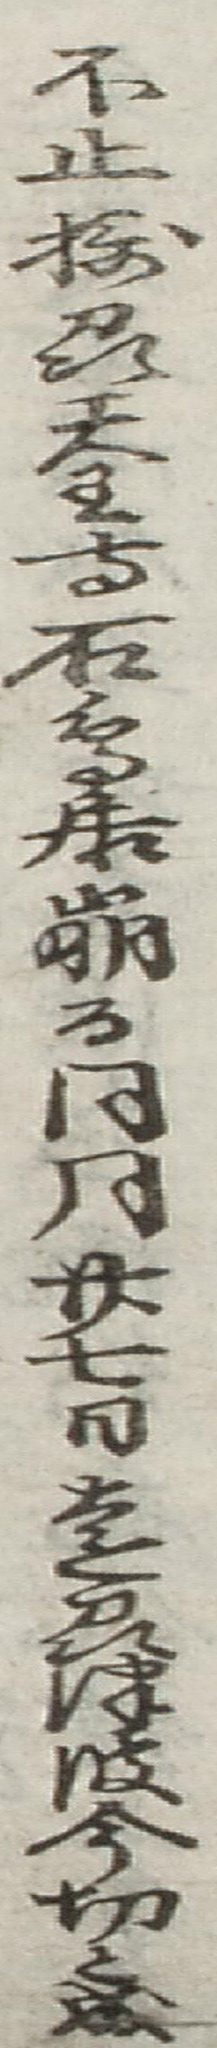不止摂州天王寺石鳥居崩る同月廿七日遠州津波今切と成
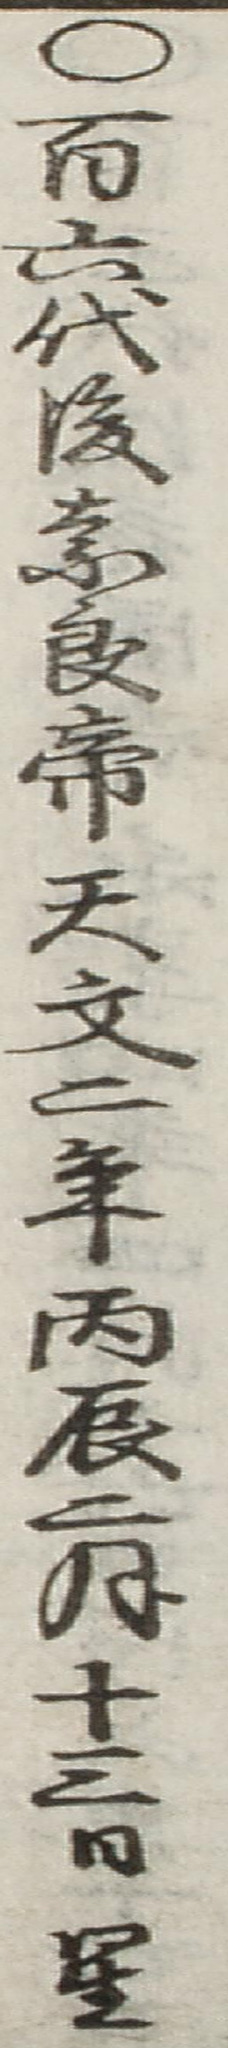○百六代後奈良帝天文二年丙辰二月十三日星
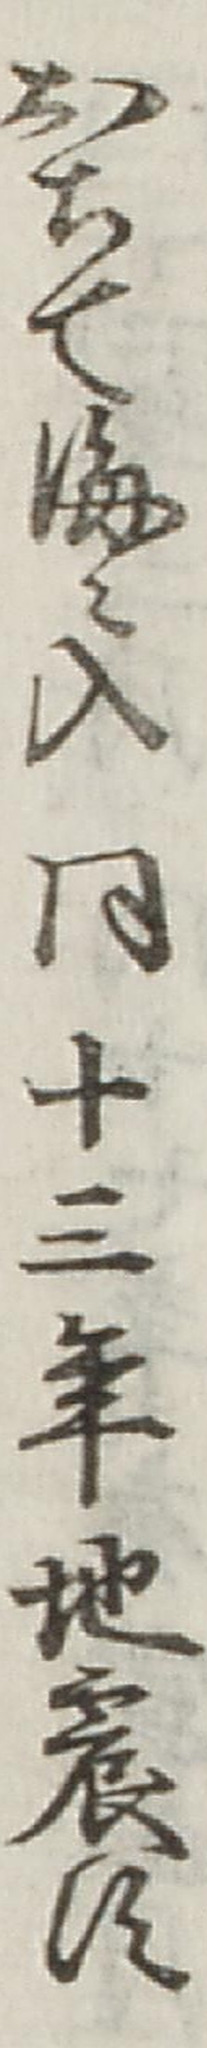おちて海に入同十三年地震す
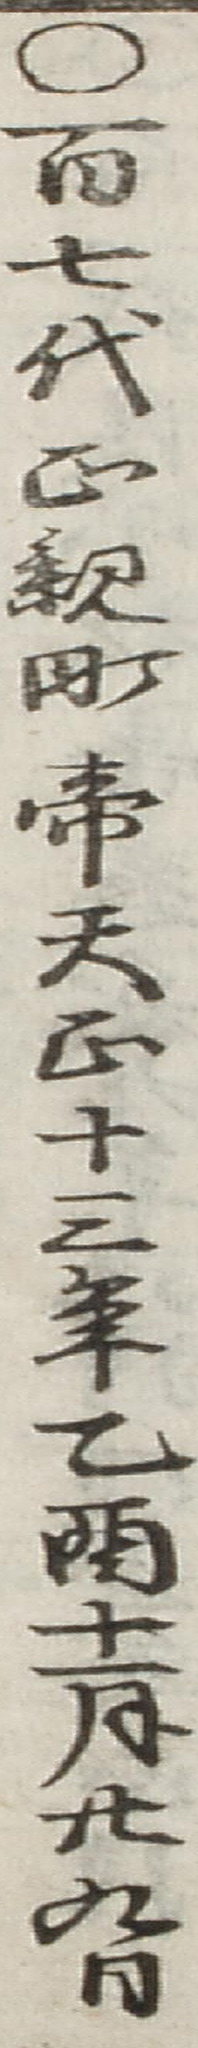○百七代正親町帝天正十三年乙酉十一月廿九日
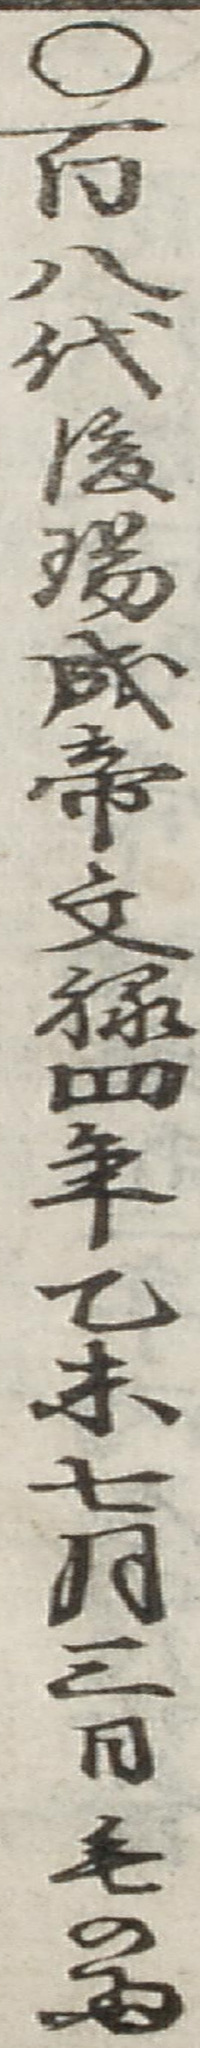○百八代後陽成帝文禄四年乙未七月三日毛の雨
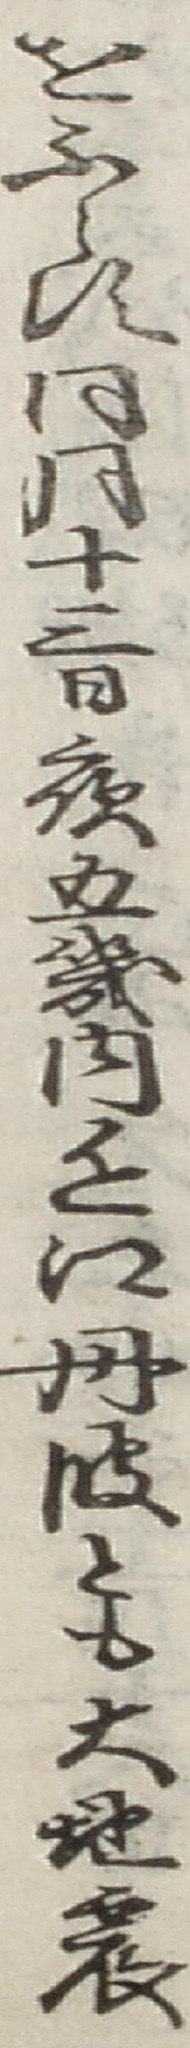をふらす同月十三日夜五畿内近江丹波とも大地震
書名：地震世直草紙　全
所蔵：東京大学地震研究所図書室 Earthquake Research Institute Library, The University of Tokyo, JAPAN
